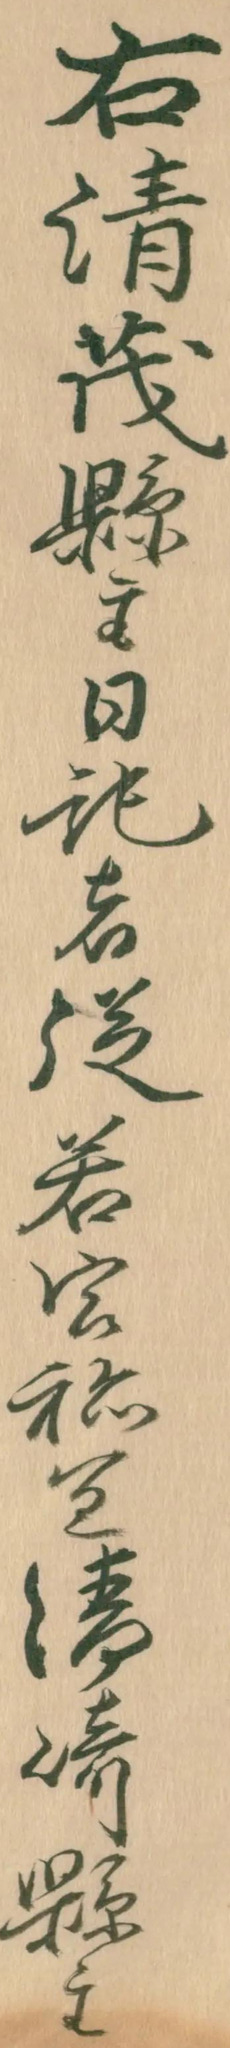右清茂県主日記者従若宮祢宜清崎県主
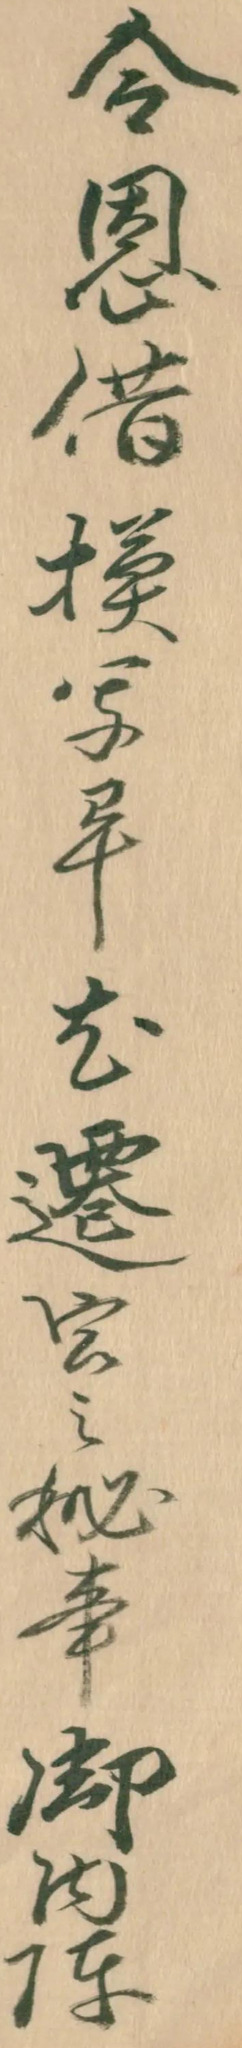令恩借模写畢尤遷宮之秘事御内陣
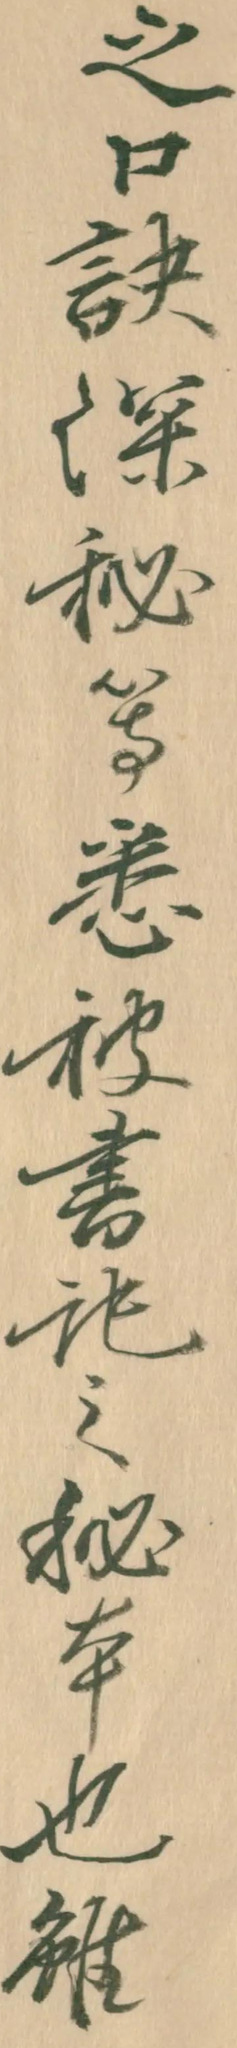之口訣深秘等悉被書記之秘本也雖
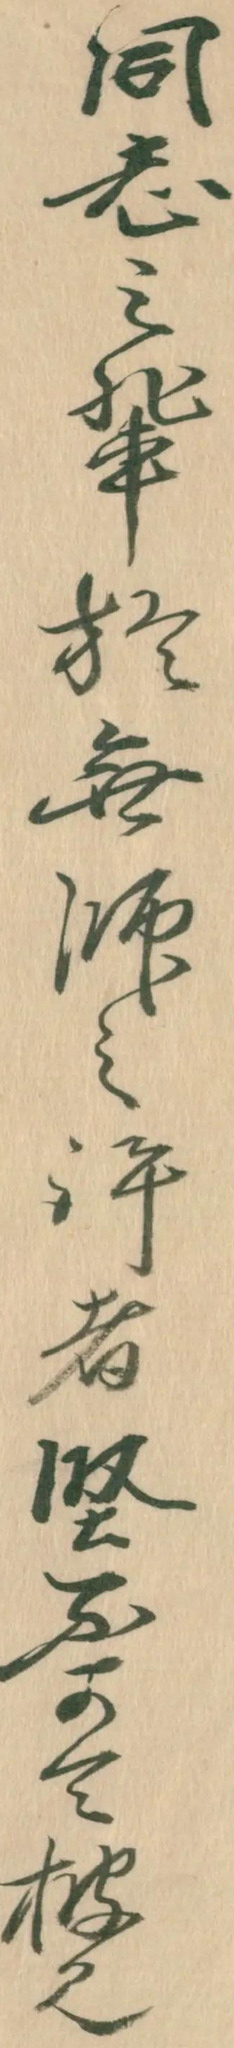同志之輩於無師之評者堅不可令披見
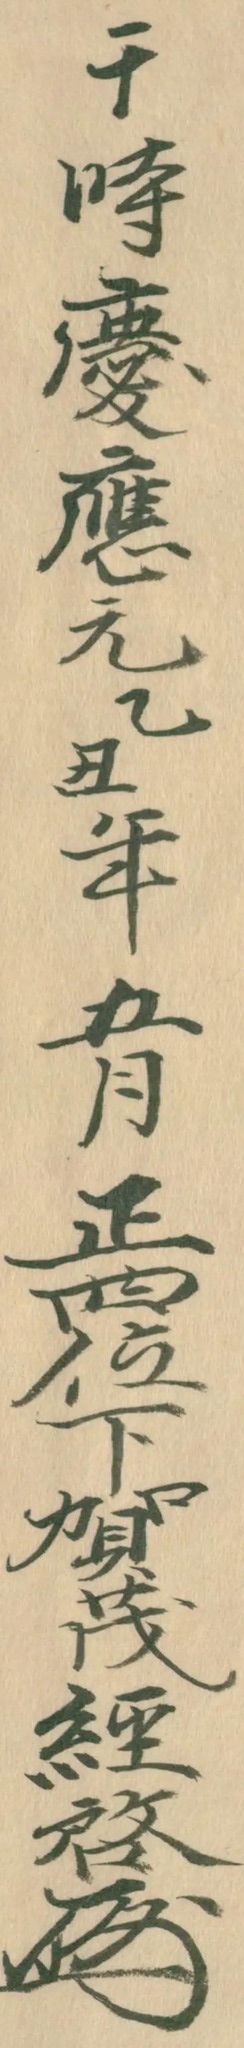于時慶応元乙丑年五月正四位下賀茂経啓
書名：賀茂社記録. 第16冊
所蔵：国立国会図書館 National Diet Library, JAPAN
